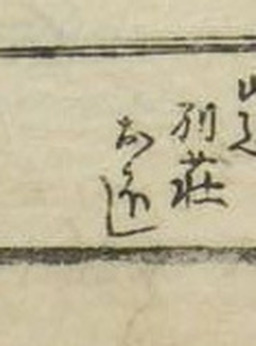おほし

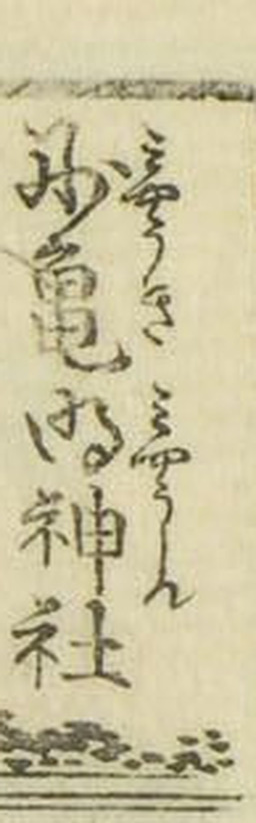妙亀明神社
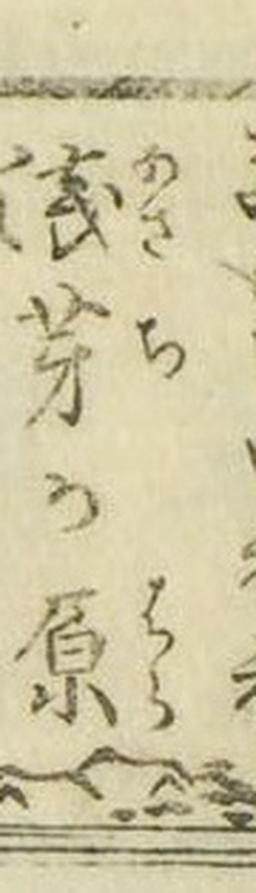浅茅か原
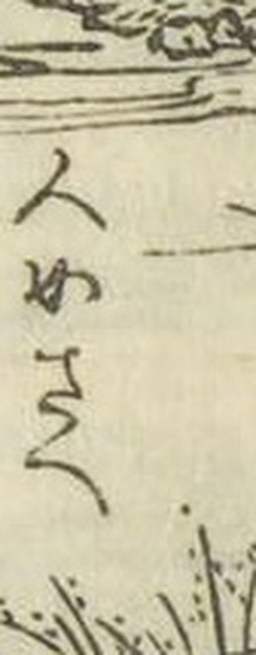人めさへ
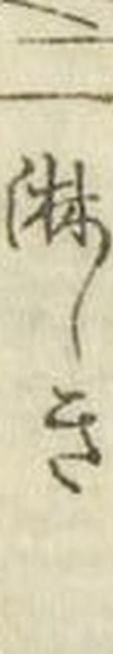淋しき
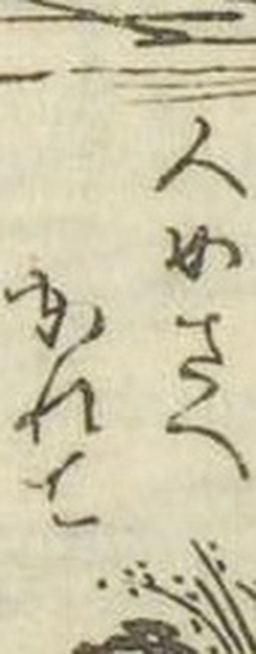かれて
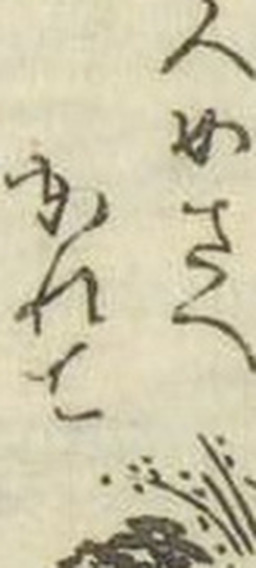かれて
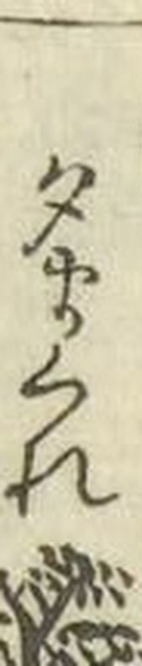夕まくれ
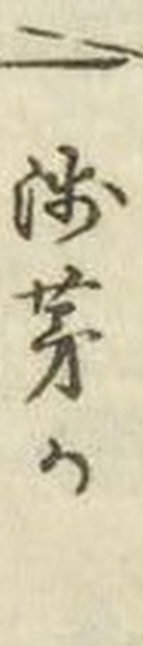浅茅か
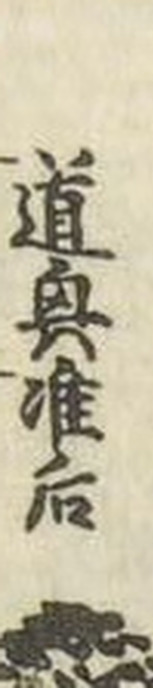道興准后
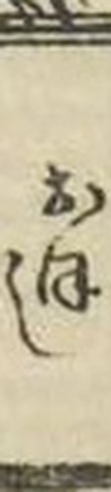おほし
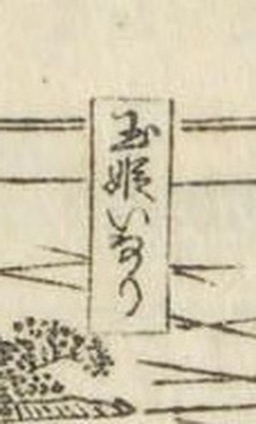玉姫いなり
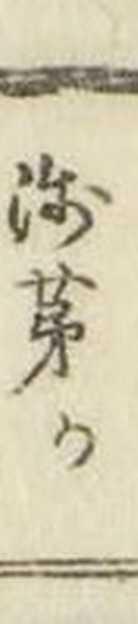浅茅か
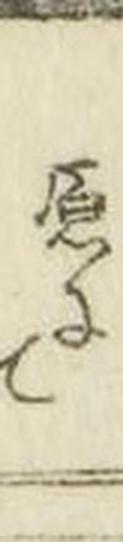原にて
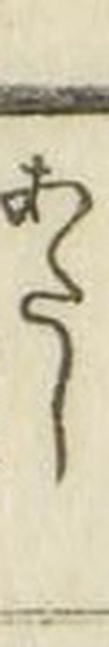あたし
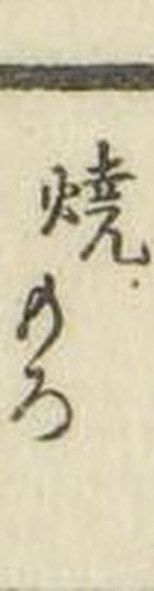焼もろ
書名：江戸名所図会 20巻 巻之17
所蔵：東京学芸大学教育コンテンツアーカイブ
